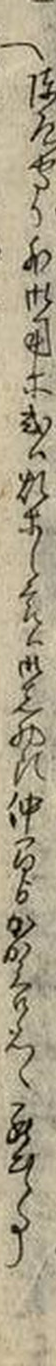陣屋守り外御用等或は煩等之節は御先物頭仲間ゟ加賀口御門へ罷出候事
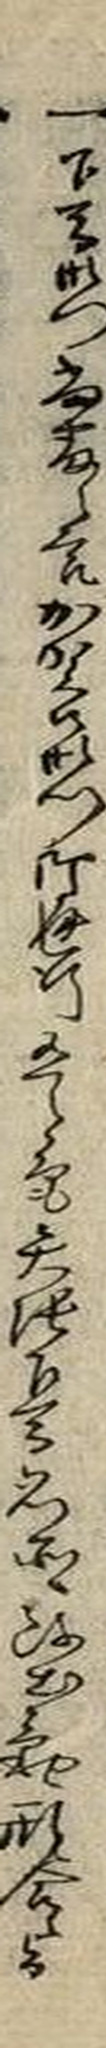一下馬御門当番之節加賀口御門御通行有之候而も矢張下馬御門所へ致出勤候形合之旨
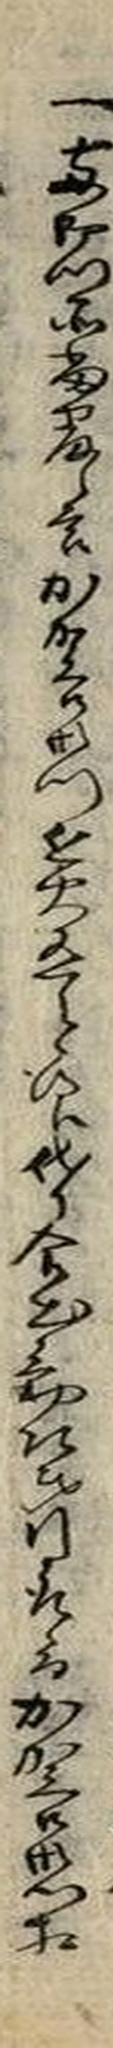一両御門所当番之節加賀口御門近火有之候儀は代り合出勤次第引取候而加賀口御門相
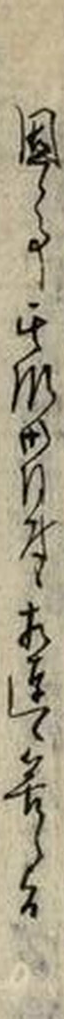固候事其段御目付へ相達候筈
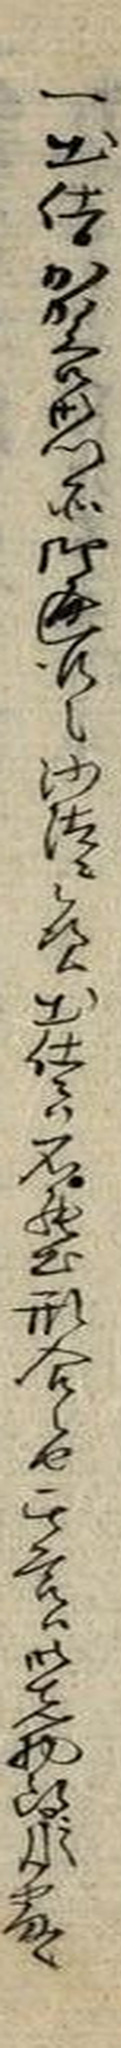一出仕日加賀口御門所御通行之沙汰に候得は出仕には不罷出形合候由其節は御先物頭之月番へ
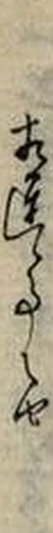相達候事之由
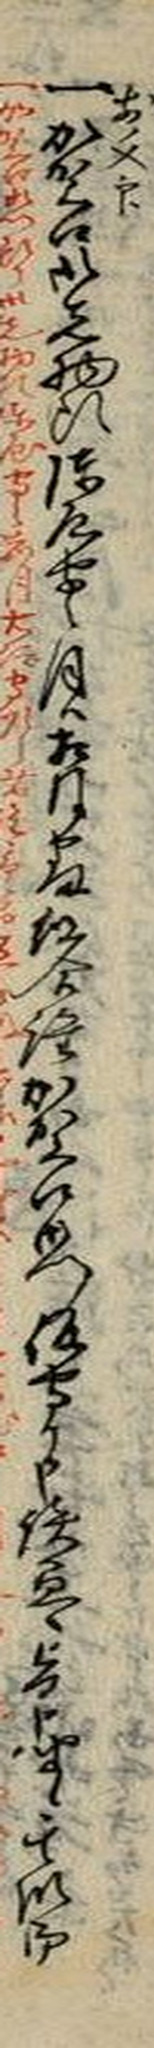一加賀口御先物頭陣屋守之月は相月番組合誰加賀口御門仮守り申談置候旨申聞候其段御
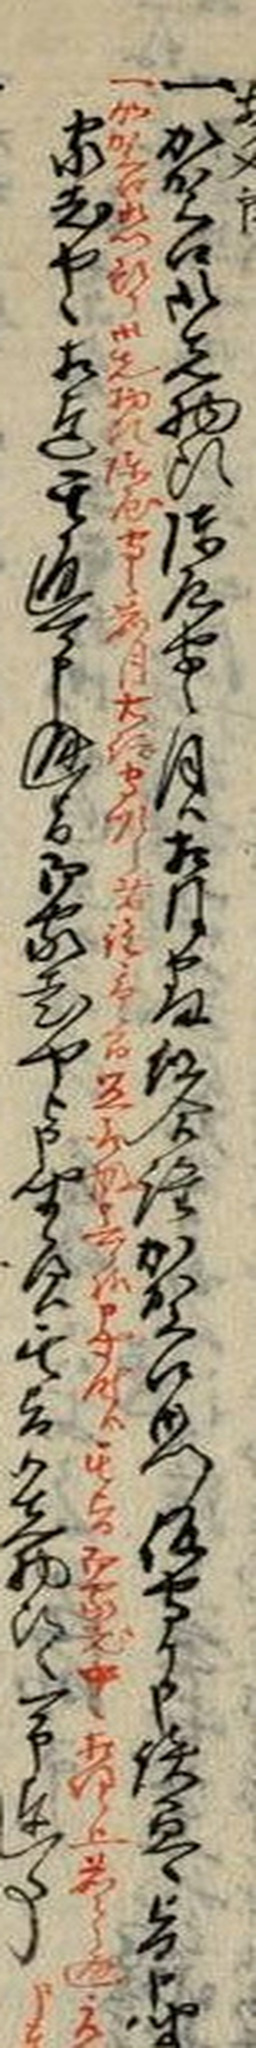家老中へ相達其通可申通旨御家老中被申聞候得は其旨御先物頭へ可申達候事
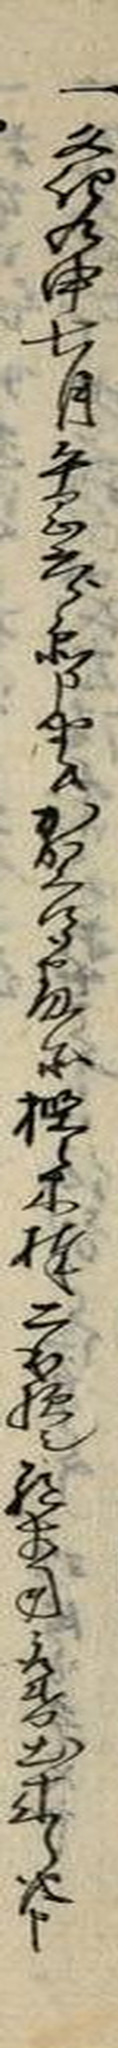一文化九申七月平岡六郎兵衛申聞候は加賀口御番所樫之木棒二本損し難相用取替出来候儀申
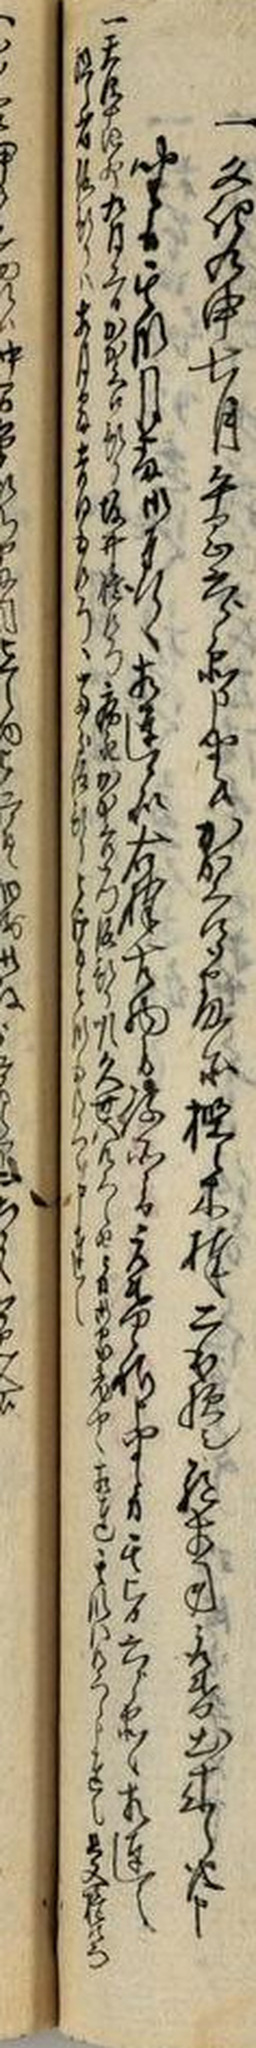聞候に付其段月番御奉行へ相達候処右棒古物方役所に而取替候様申聞候に付其旨六郎兵衛へ相達之
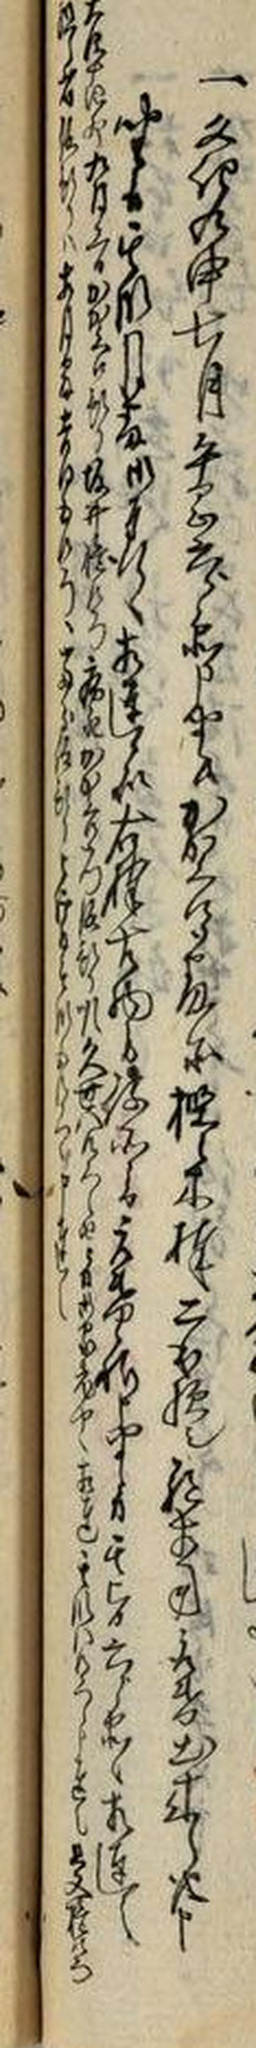聞候に付其段月番御奉行へ相達候処右棒古物方役所に而取替候様申聞候に付其旨六郎兵衛へ相達之
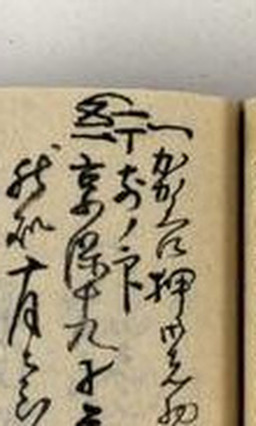一丁前之印
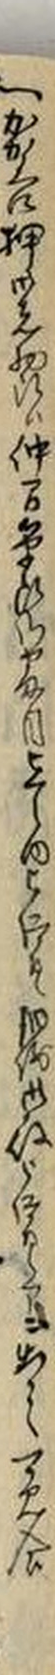一加賀口押御先物頭は仲間筆頭弐番目迄之内被仰付候旧例御役被仰付候部に出之可見合
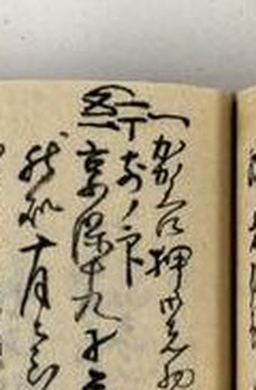一丁前之印
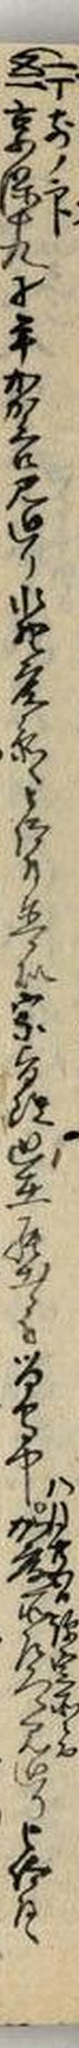一享保十九寅年加賀口見廻り水野藤兵衛へ被仰付置候処宗旨改廻在罷出候ニ付留守中八月廿五日評定所ニ而加藤所左衛門見廻り被仰付候
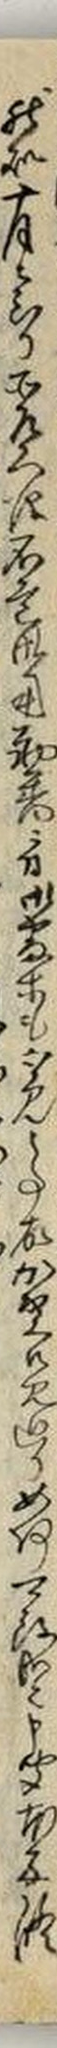然処十月に至り所左衛門儀不意御用勤番に付御番等も御免候事故加賀口見廻り如何可致哉と申聞本多修
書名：御門御櫓之部
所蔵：福井県文書館 Fukui Prefectural Archives
